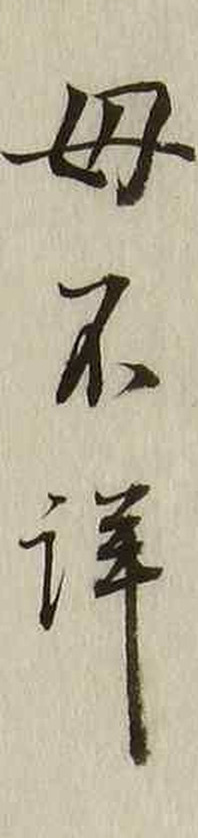母不詳
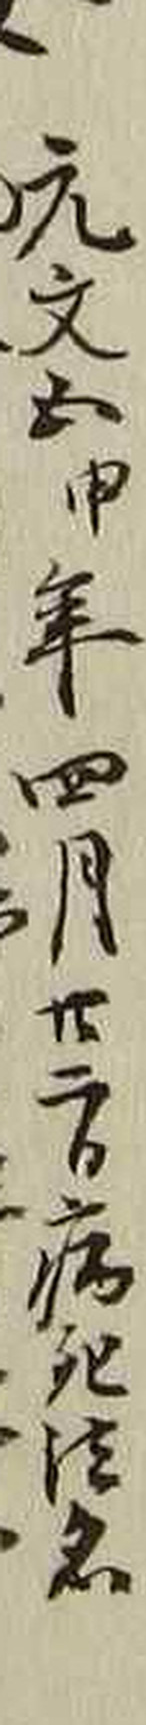元文五申年四月廿二日病死法名
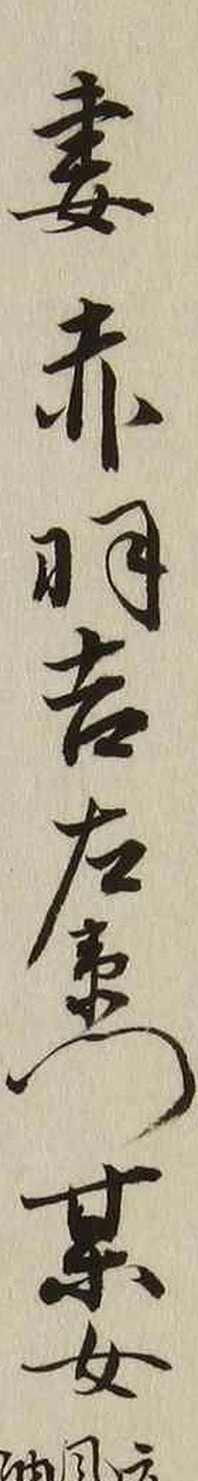妻赤羽吉左衛門某女
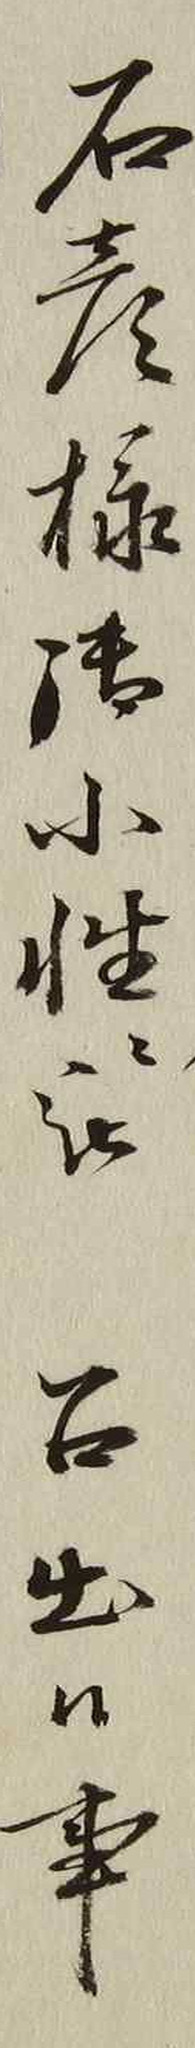石彦様御小姓ニ召し出され候事
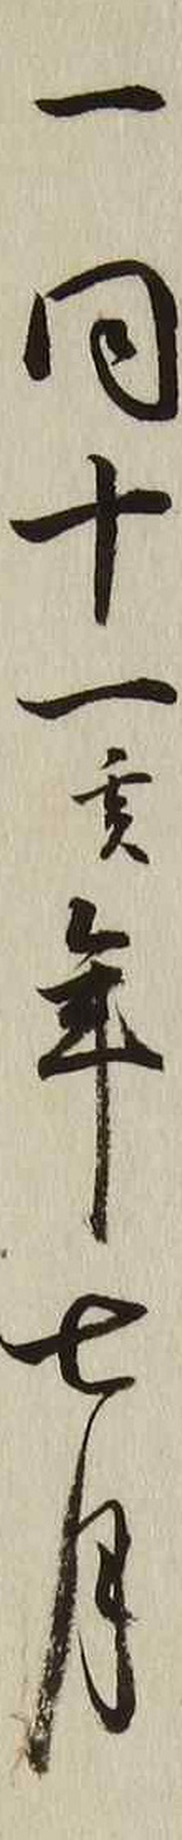一同十一亥年七月
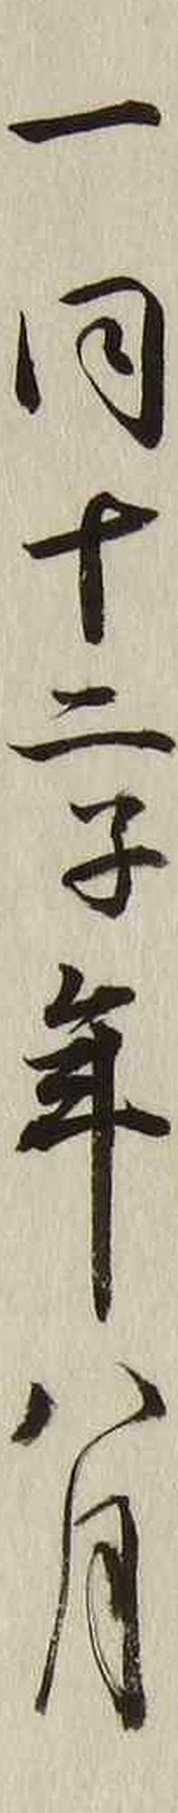一同十二子年八月
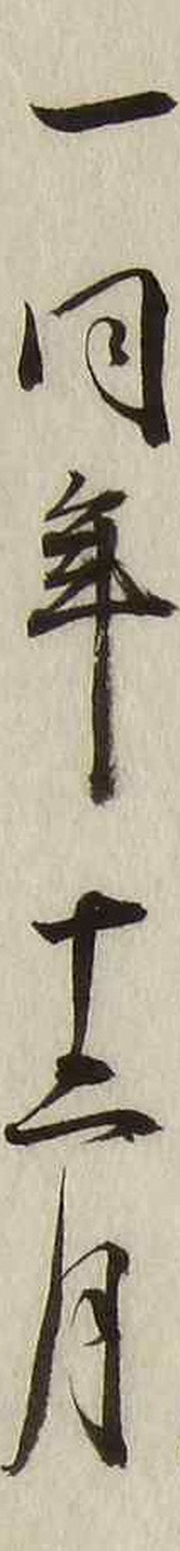一同年十二月

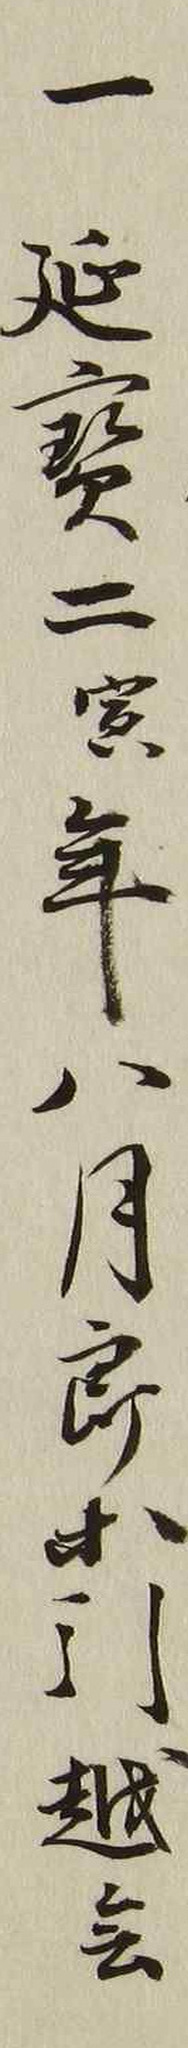一延宝二寅年八月艮へ引越し会
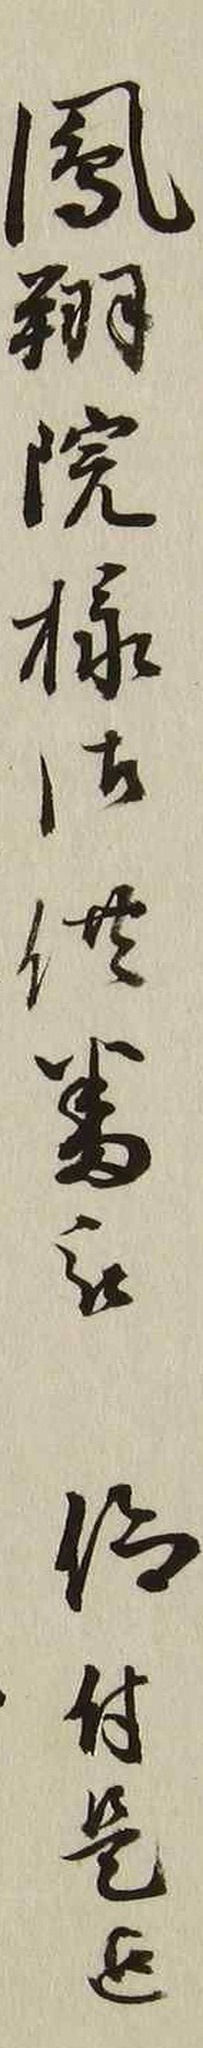鳳翔院様御供番仰せ付けられ是迄
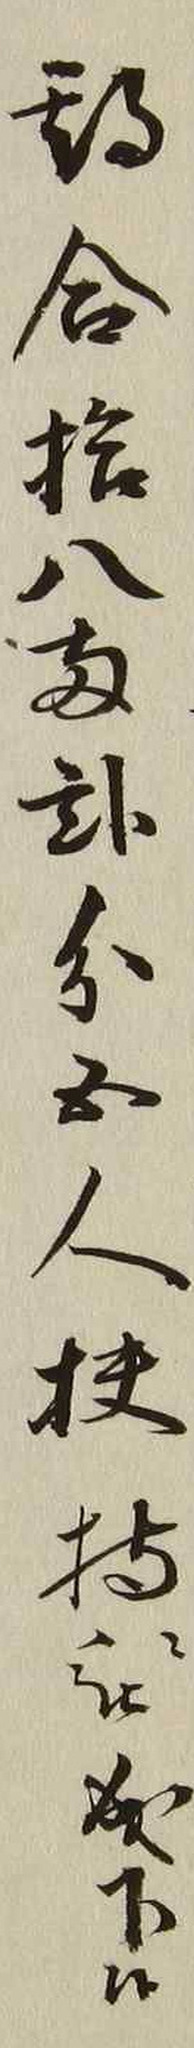都合拾八両弐分五人扶持成し下され候
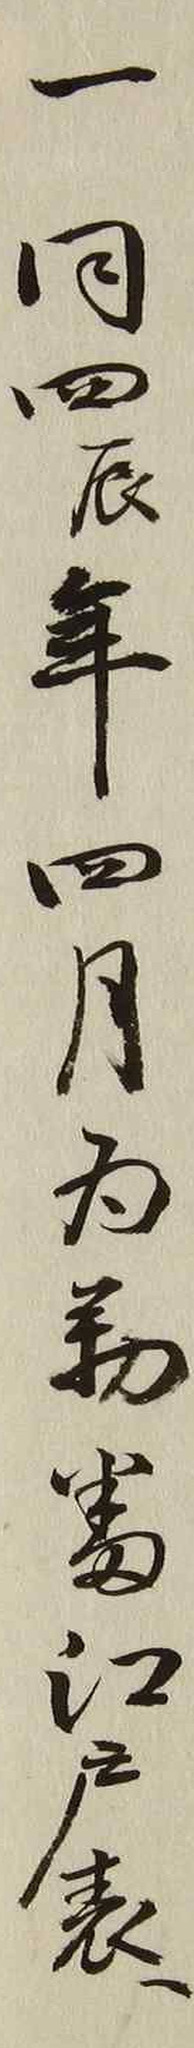一同四辰年四月勤番之為江戸表へ
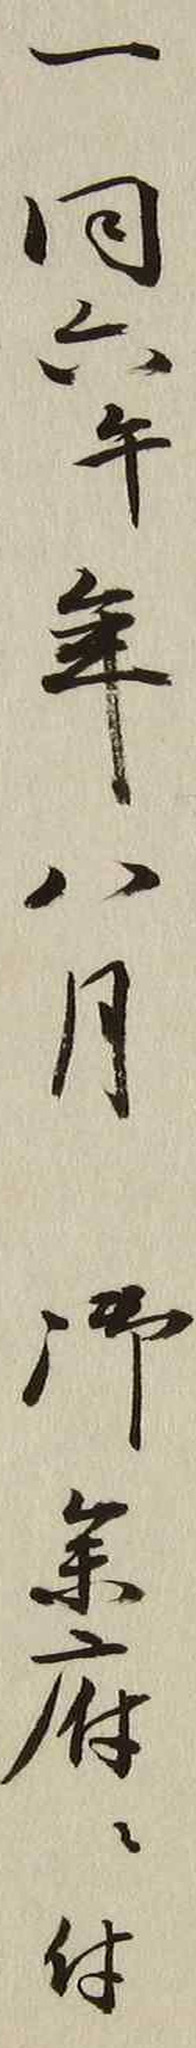一同六午年八月御参府ニ付き
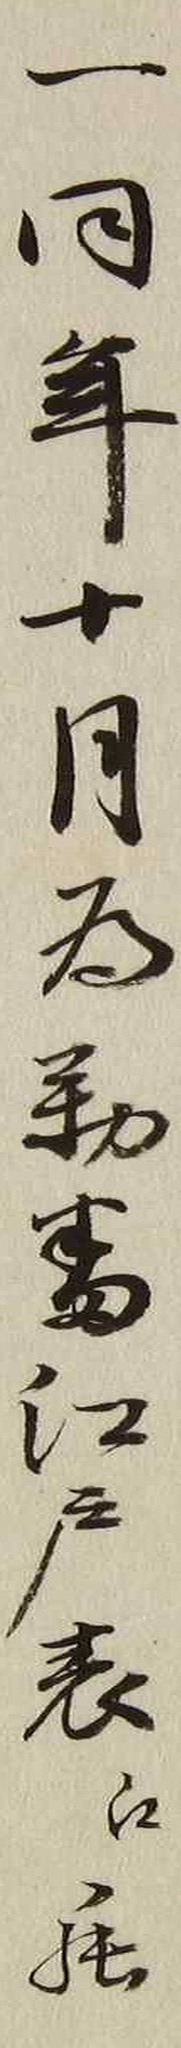一同年十月勤番之為江戸表へ罷り
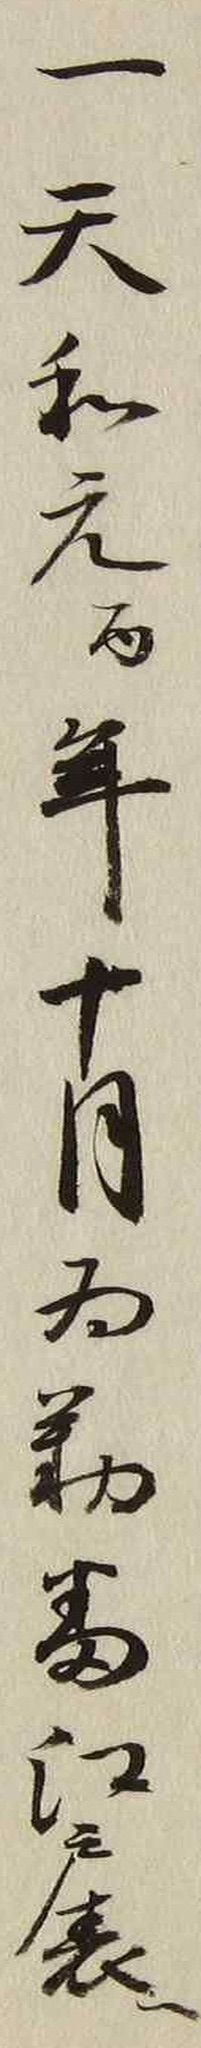一天和元酉年十月勤番之為江戸表へ
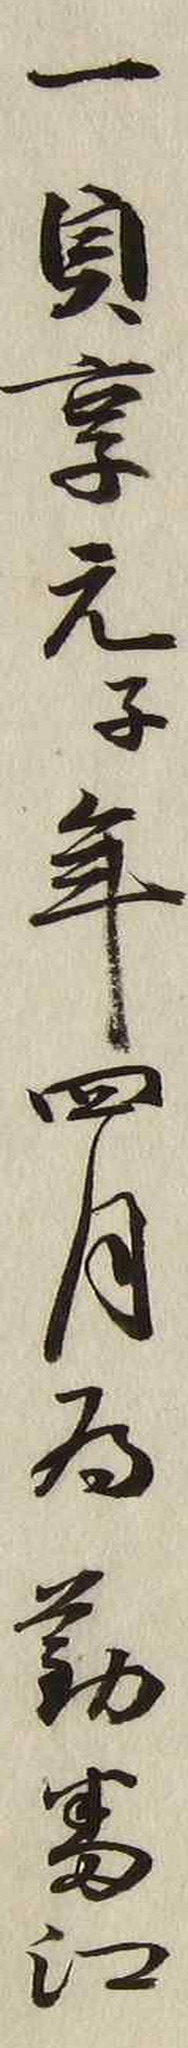一貞享元子年四月勤番之為江
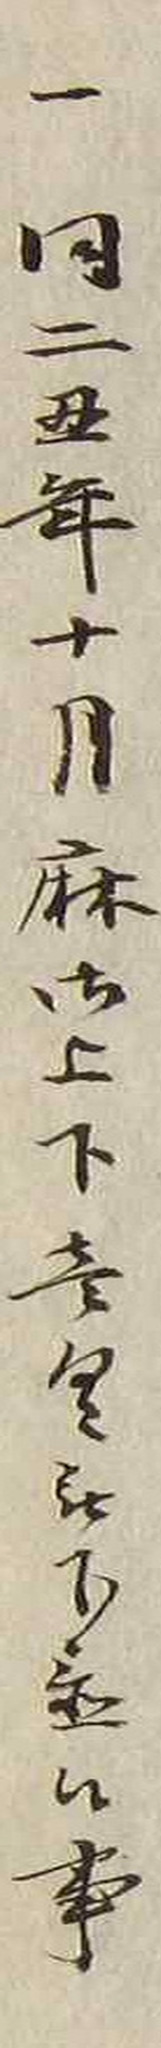一同二丑年十月麻御上下壱具下し置かれ候事
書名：諸士系譜　巻之19　い之部19
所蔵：会津若松市立会津図書館
